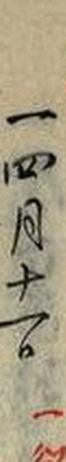一四月十一日
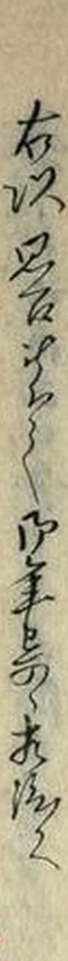右以思召被下之御年寄へ相渡ス
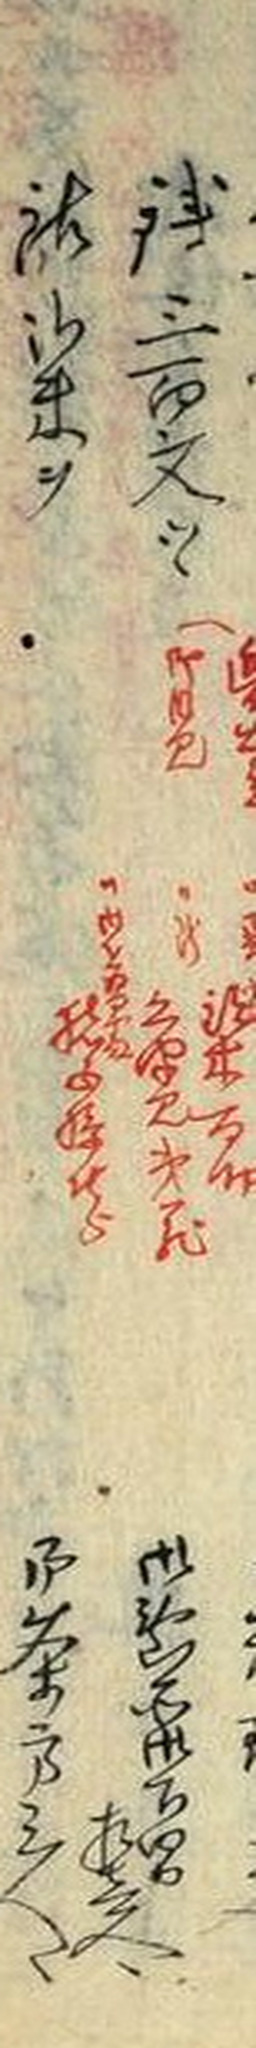銀弐朱ヲ御茶方三人へ
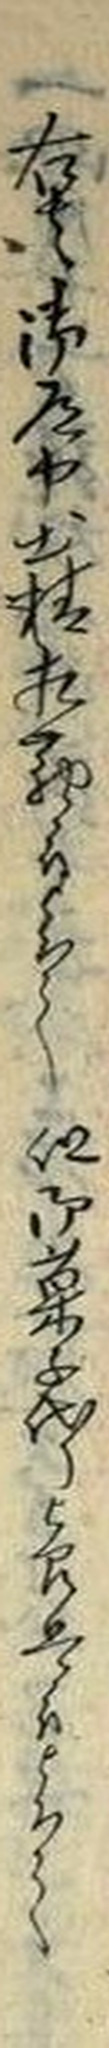右者御道中出精相勤候ニ付被下之但御菓子代り被召上候ニ付被下之

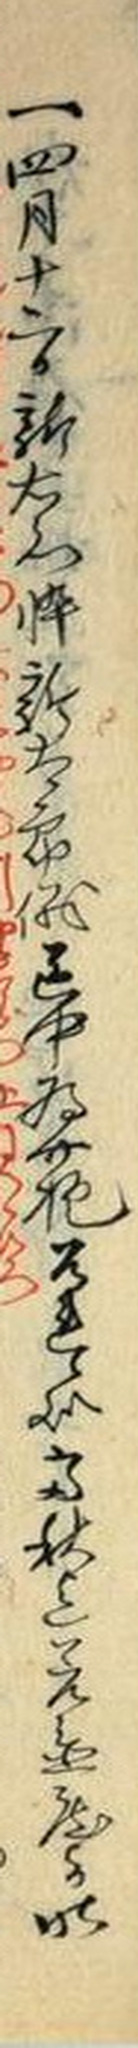一四月十二日新右衛門伜新太郎儀道中為介抱召連候処当秋迄差置度旨昨
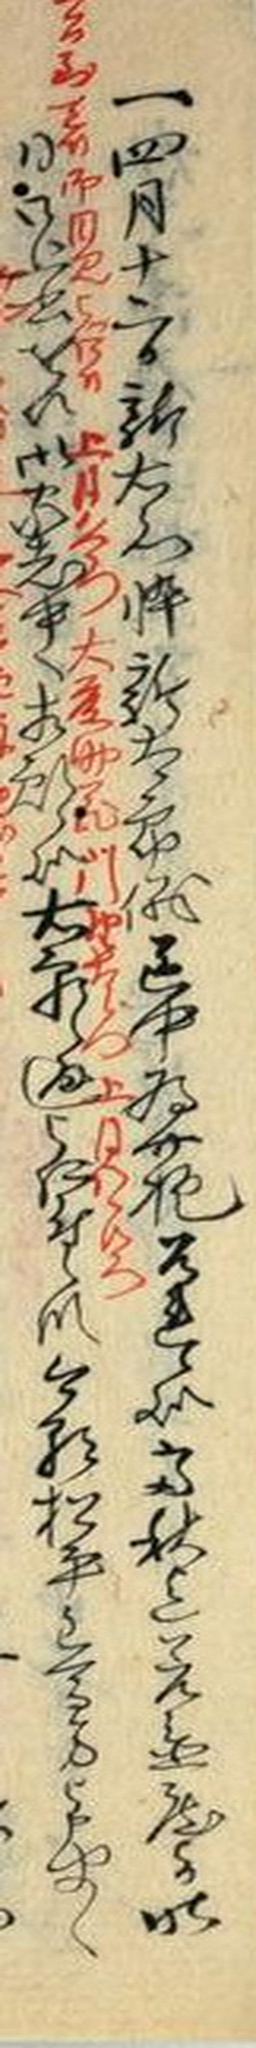日御上書を以御家老中へ相願候処右願之通被仰付候段今朝松平主馬方被申聞候
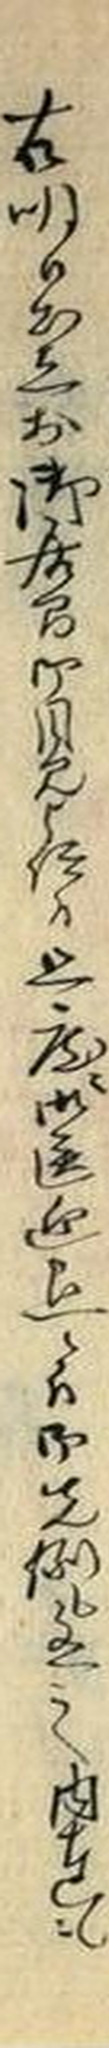右明日出立於御居間御目見被仰付且度々御送迎申上候ニ付御先例も有之内達も
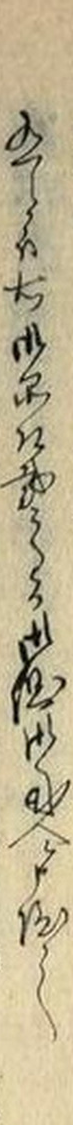有之候ニ付右御品頂戴之旨御側御用人被申渡之
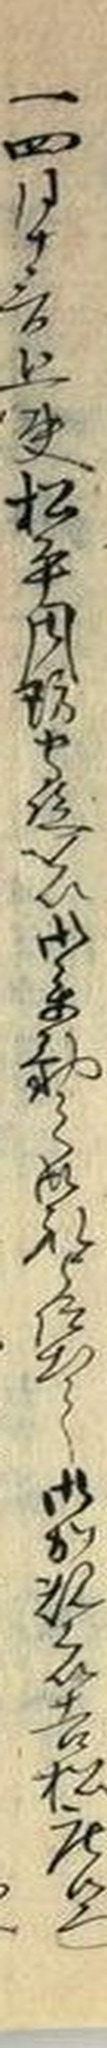一四月十三日上使松平周防守殿を以御参勤之御礼被仰出之御加規衆吉松庄右衛門
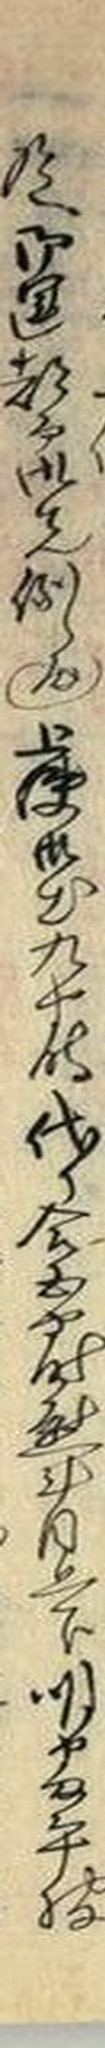殿へ御宣都而御先例之通上使御出九半時代り合五半時熨斗目上下明番平服
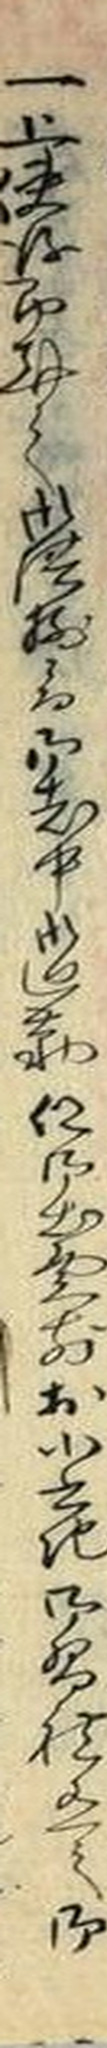一上使後即刻之御供揃ニ而御老中御廻勤但御出殿前於小書院御習礼有之御
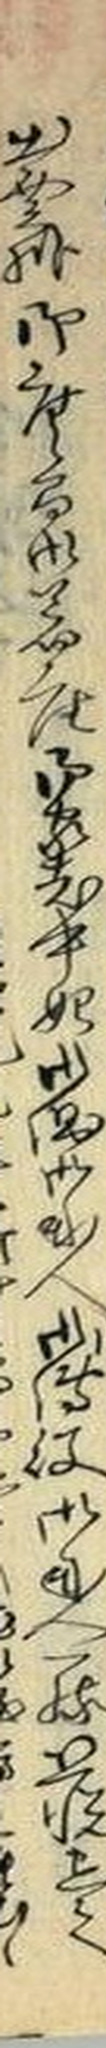出殿掛御座之間御着座御家老中始御側御用人御傅役御用人一統恐悦申上之
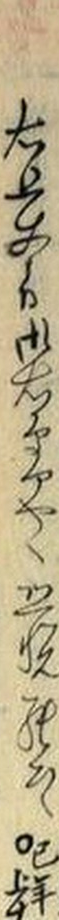右上使ニ付御右筆部やへ恐悦罷出候
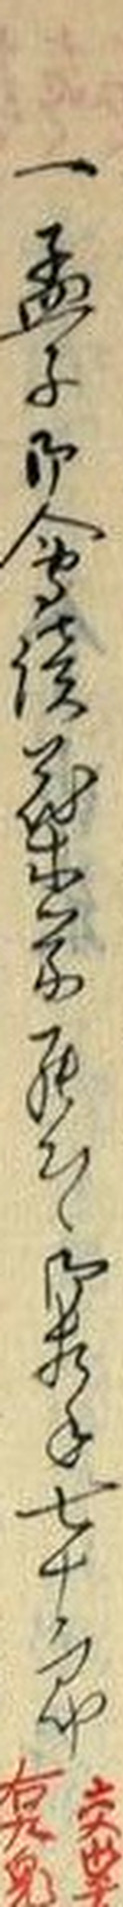一孟子御会読花木栄罷出候御相手七十郎
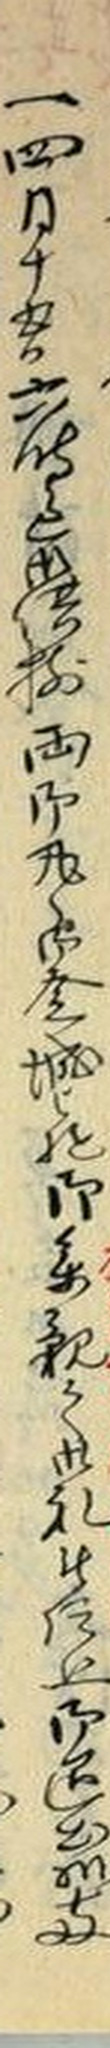一四月十五日六時過御供揃両御丸へ御登城被遊御参観之御礼被仰上御退出掛両
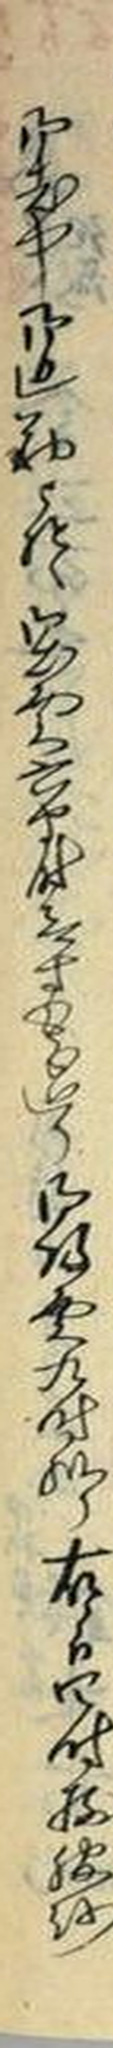御老中御廻勤被遊候御出殿六半時壱寸五分廻り御帰殿九時掛り右ニ付四時揃服紗
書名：少傅日録抄（斉承付側向頭取日記、在府）
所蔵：福井県文書館 Fukui Prefectural Archives
